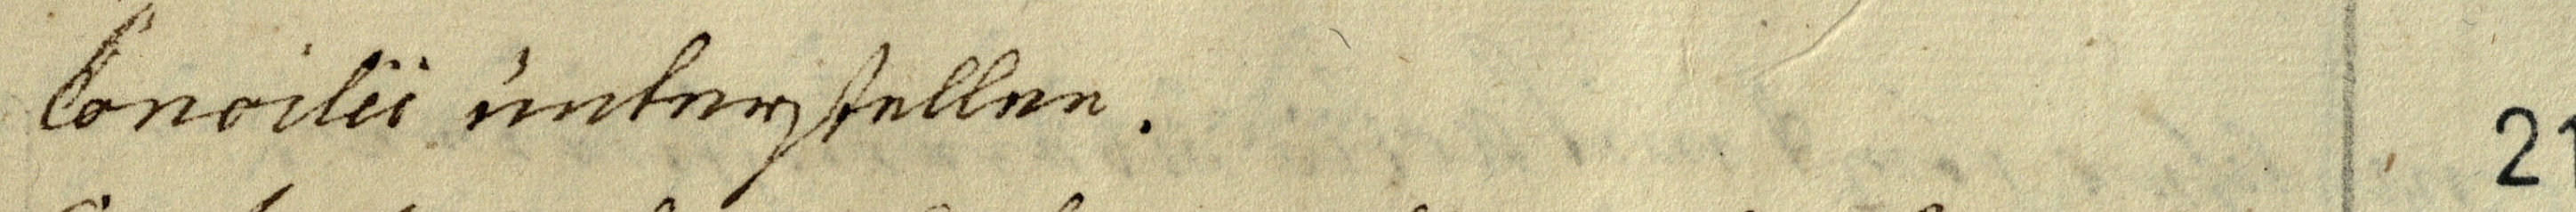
Concilii unterstellen.
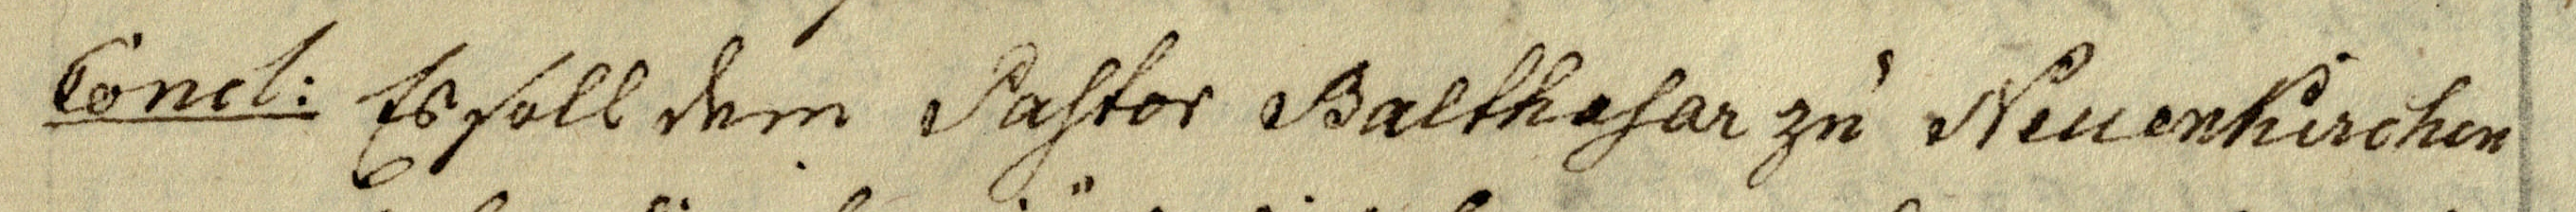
Concl. Es soll dem Pastor Balthasar zu Neuenkirchen
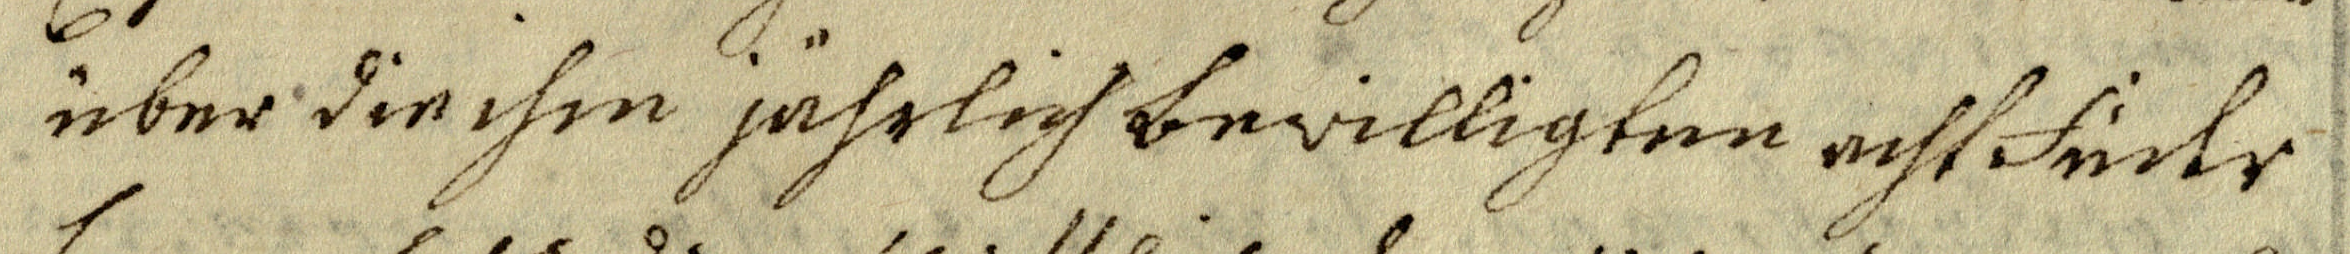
über die ihm jährlich bewilligten acht Fuder
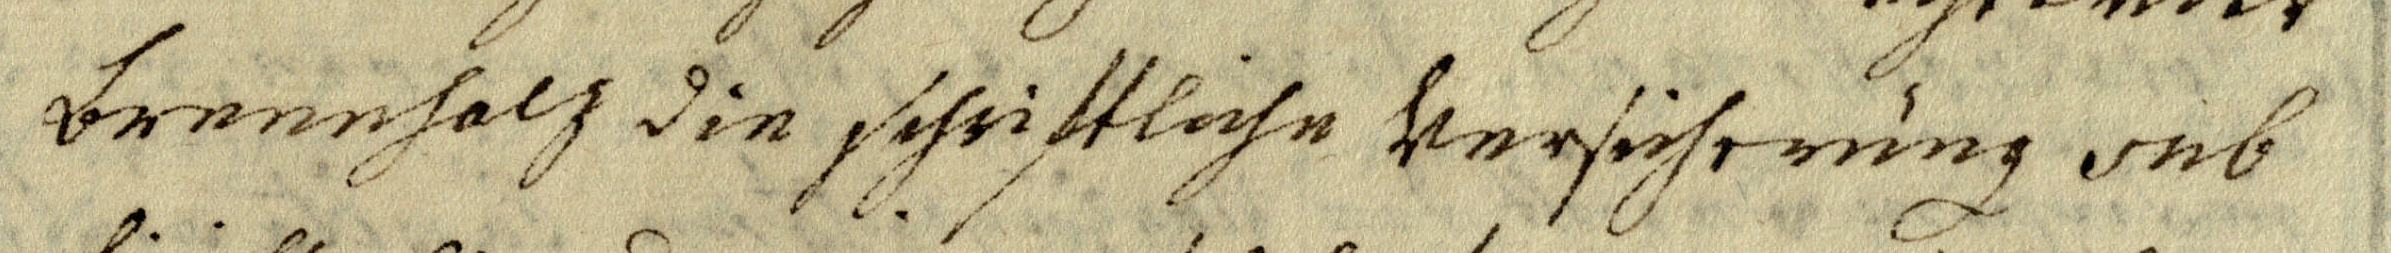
Brennholz die schriftliche Versicherung sub
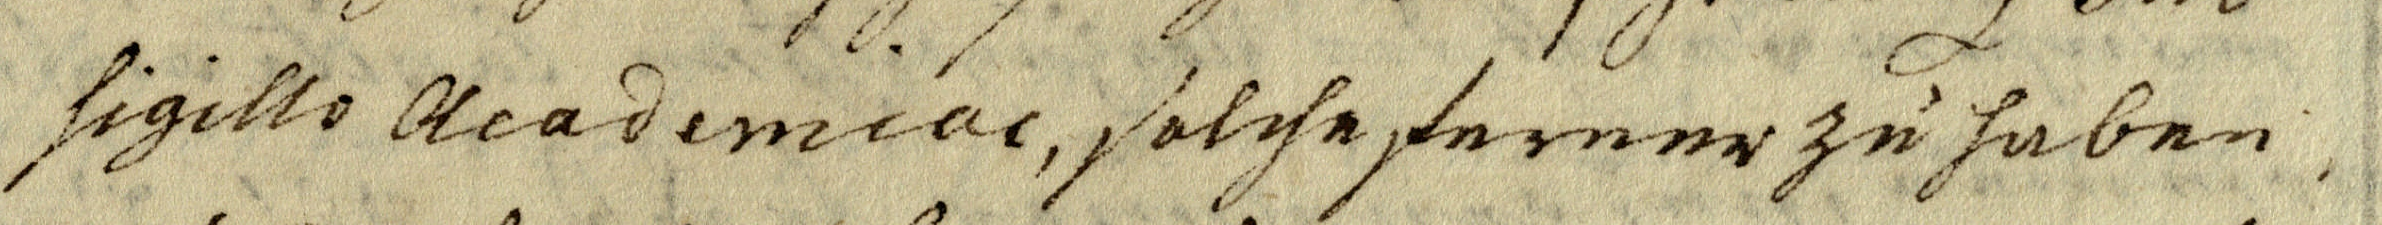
sigillo Academiae, solche ferner zu haben,
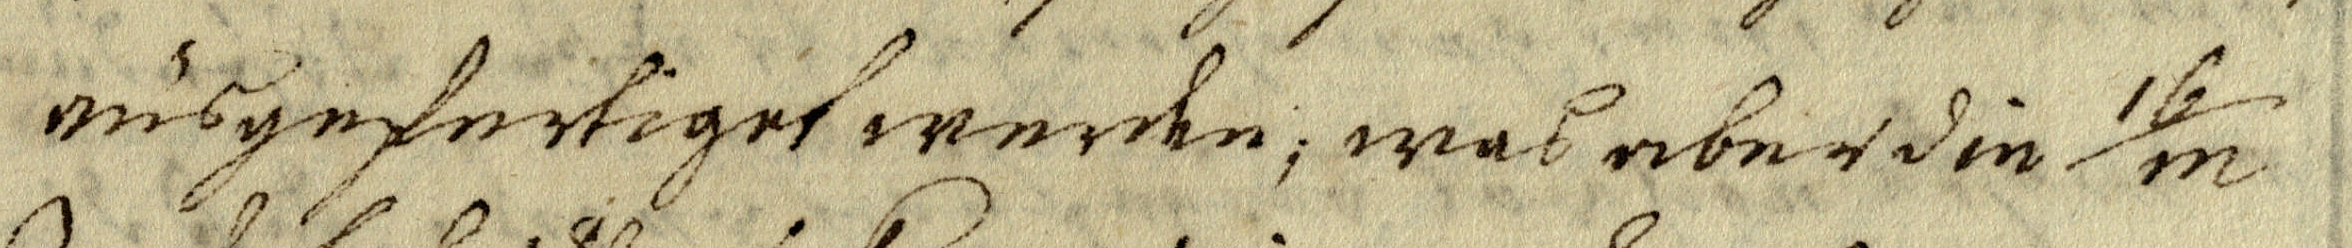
ausgefertiget werden, was aber die 16/m
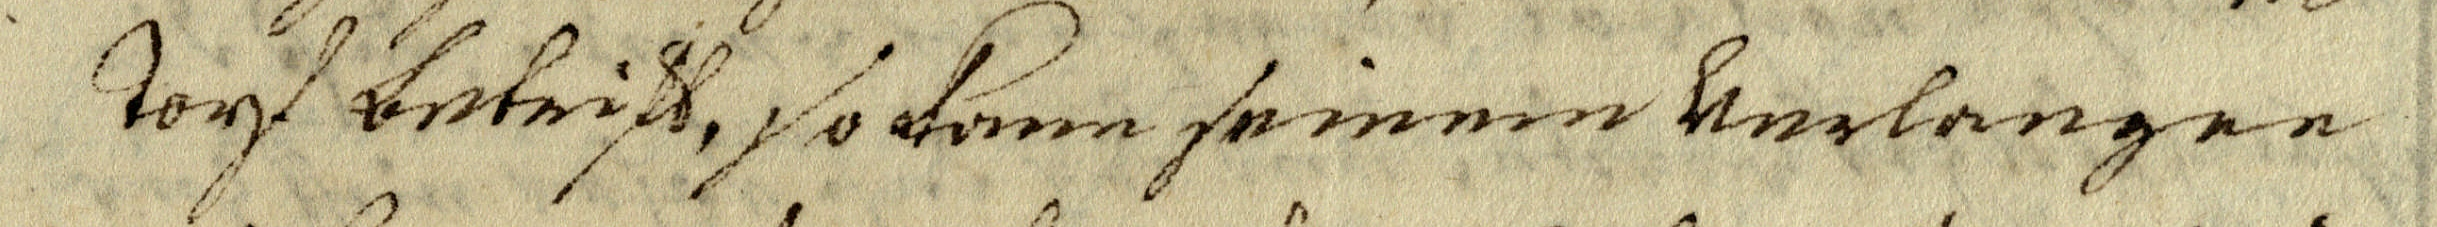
Torf betrift, so kann seinem Verlangen
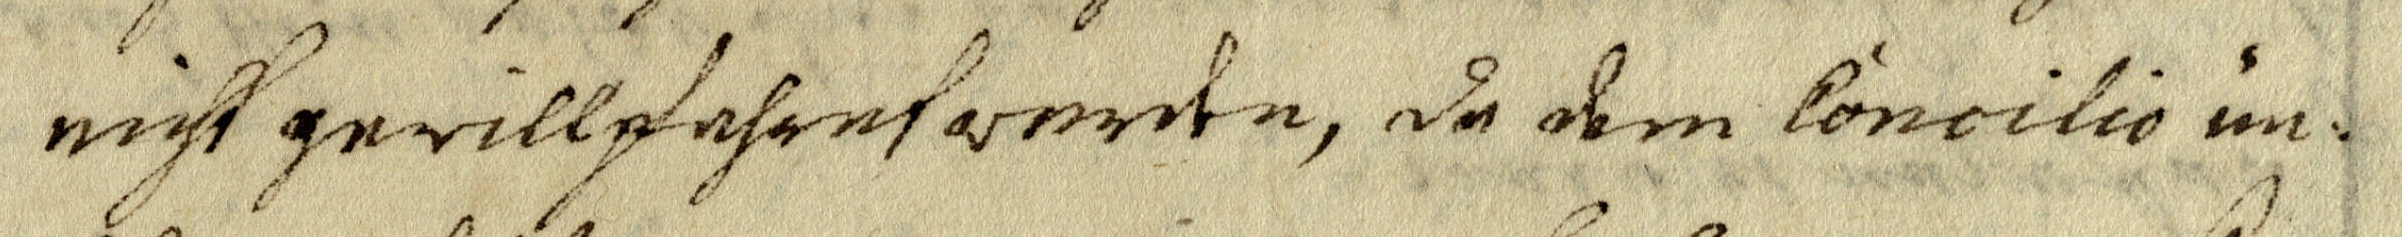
nicht gewillfahret werden, da dem Concilio un¬
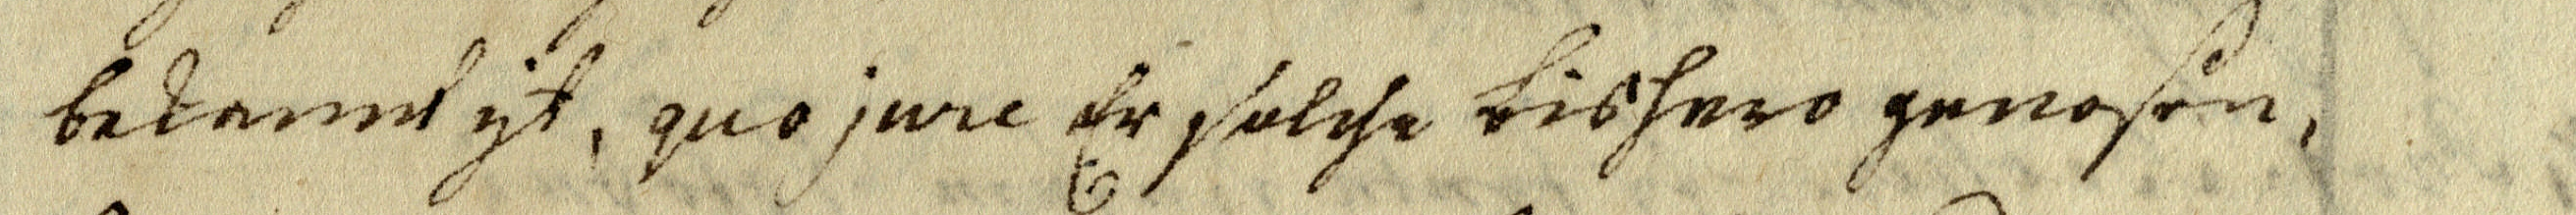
bekannt ist, quo jure Er solche bishero genoßen,
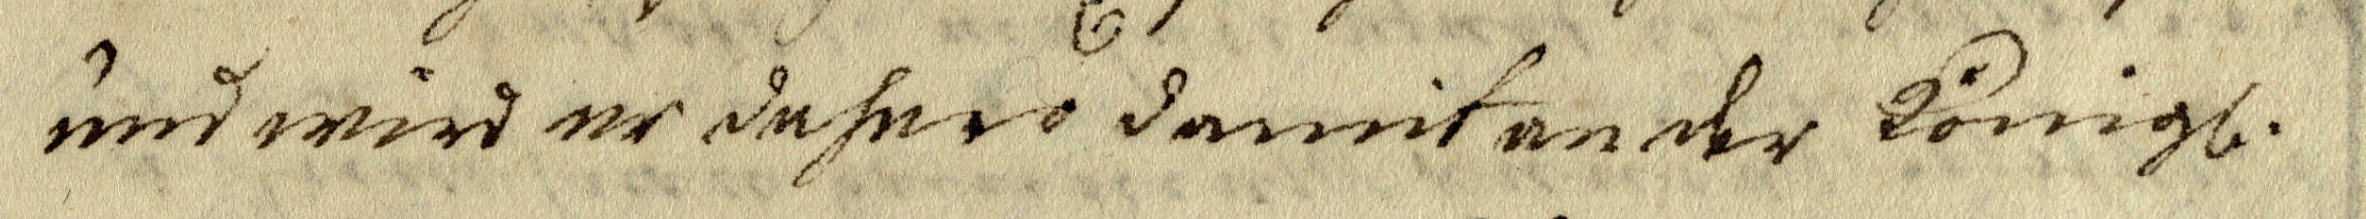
und wird er dahero damit an der Königl.
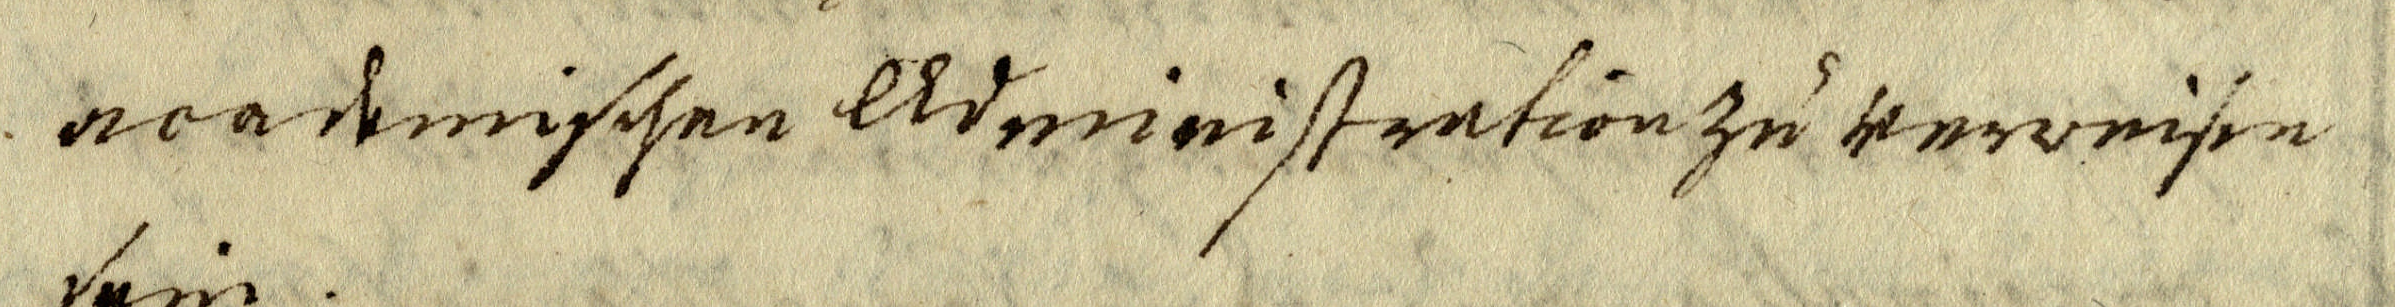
academischen Administration zu verweisen
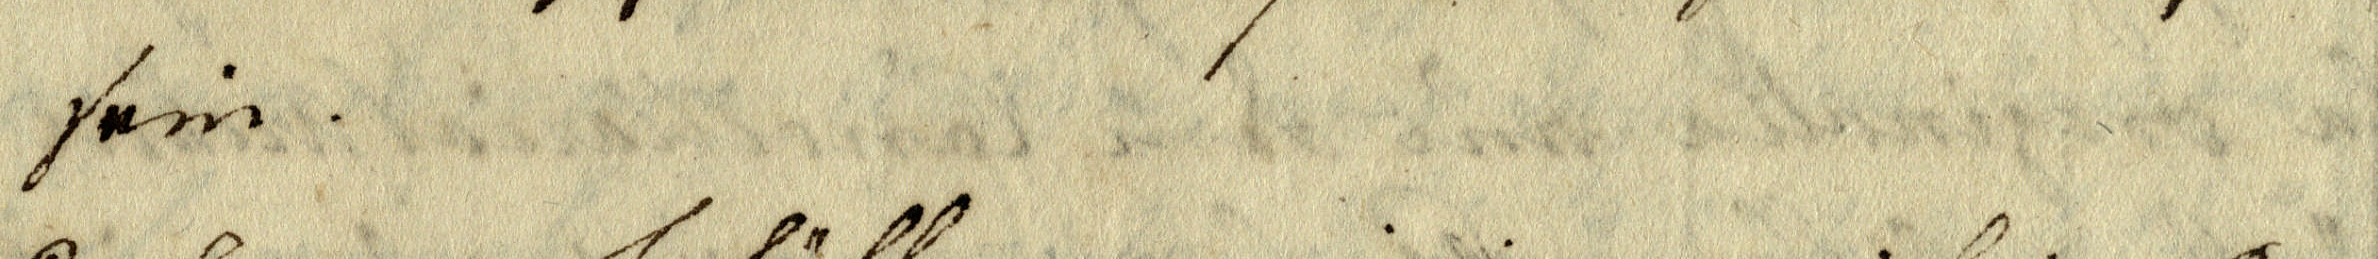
sein.
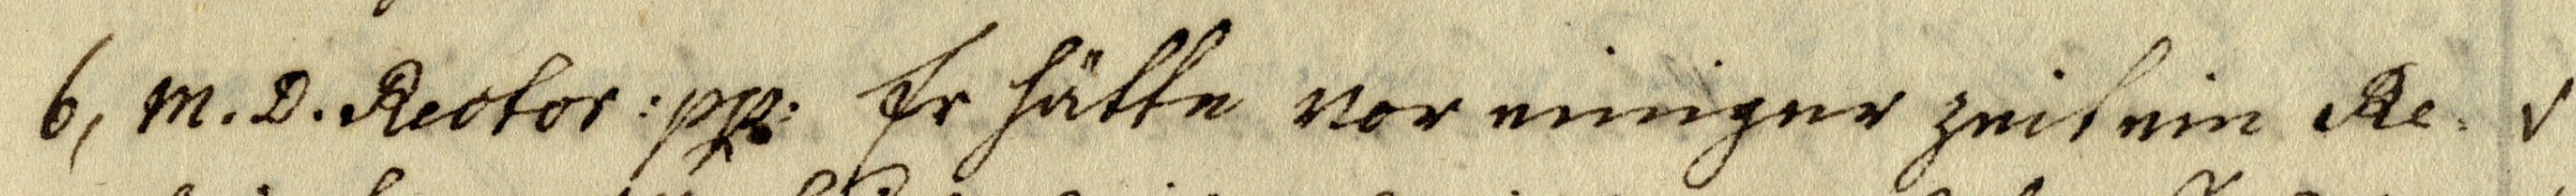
6, M. D. Rector pp. Er hätte vor einiger zeit ein Re¬
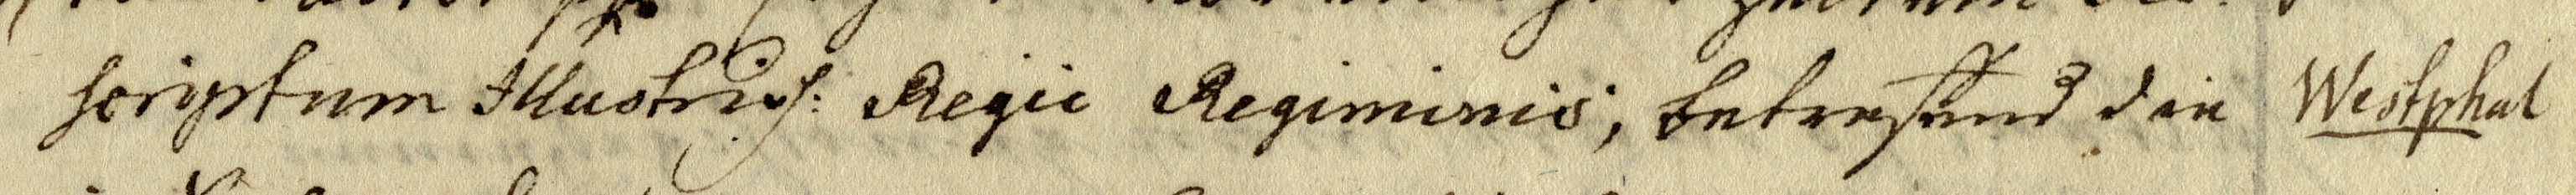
scriptum Illustriss. Regii Regiminis, betreffend den
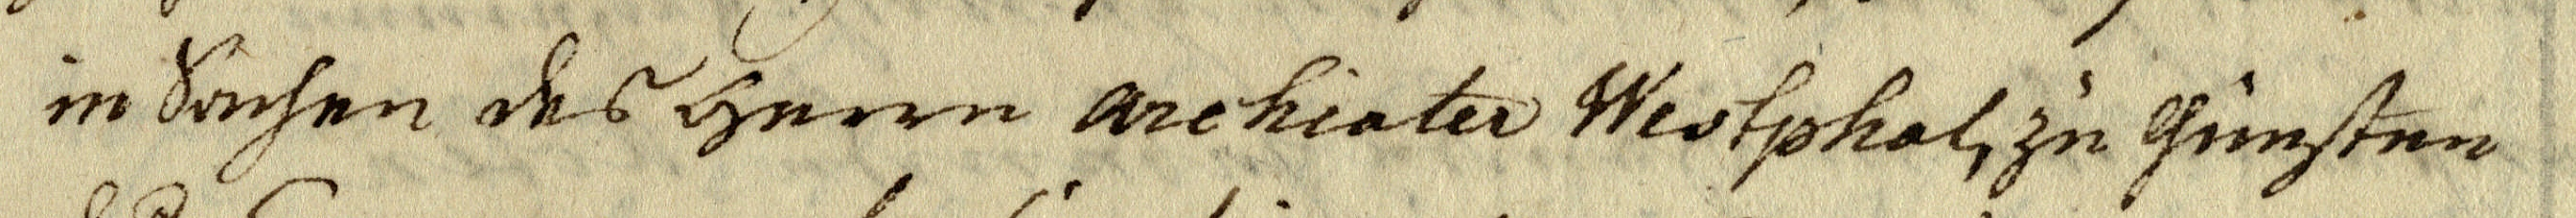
in Sachen des Herrn Archiater Westphal zu Gunsten
